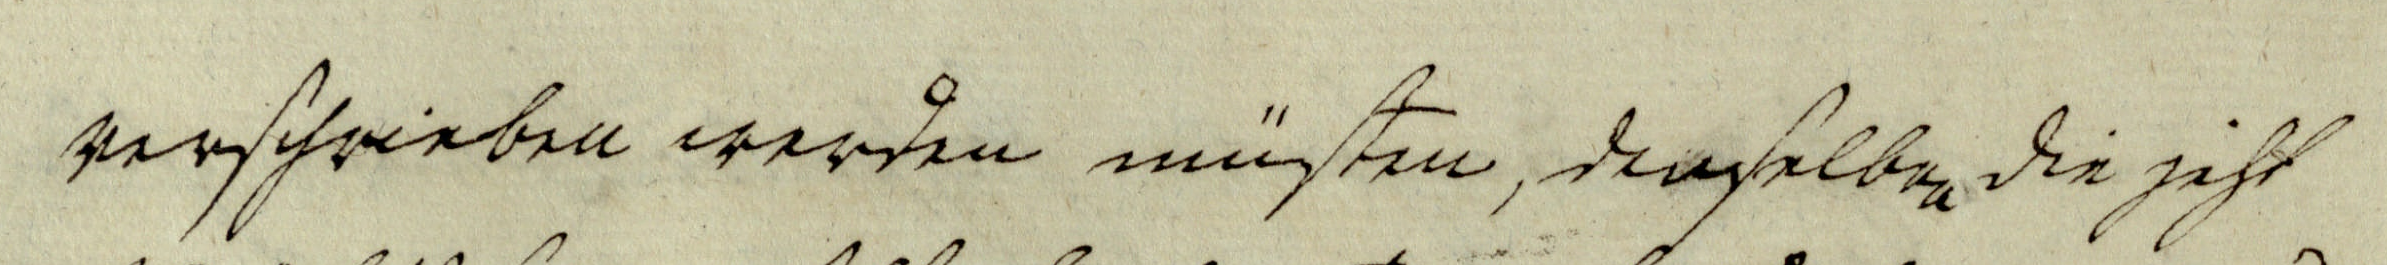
verschrieben werden müßten, denselben die jetzt
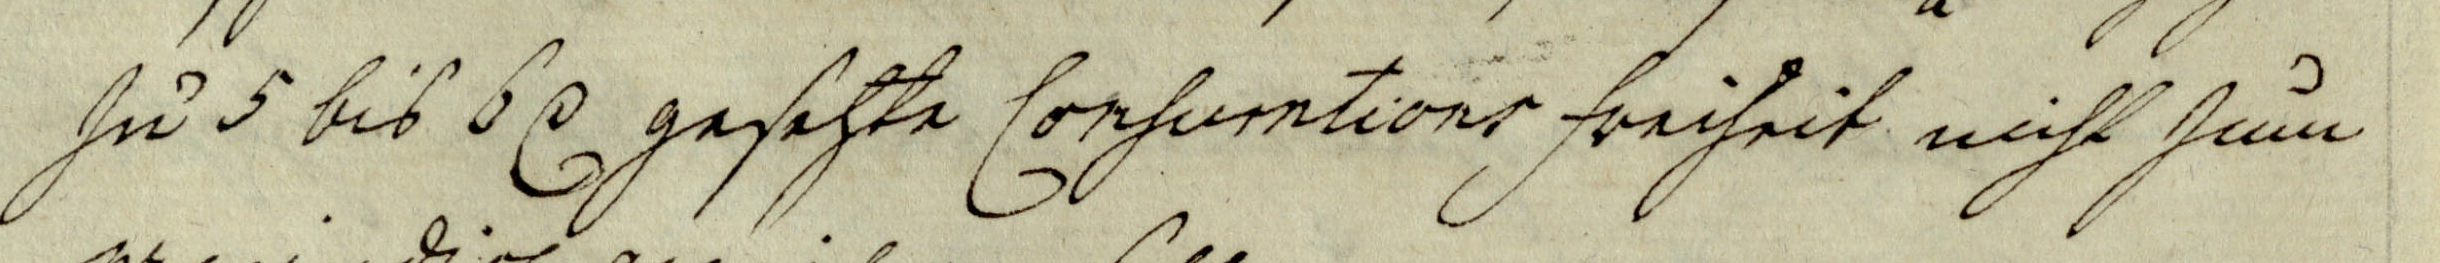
zu 5 bis 6 l . gesetzte Consumtions Freiheit nicht zum
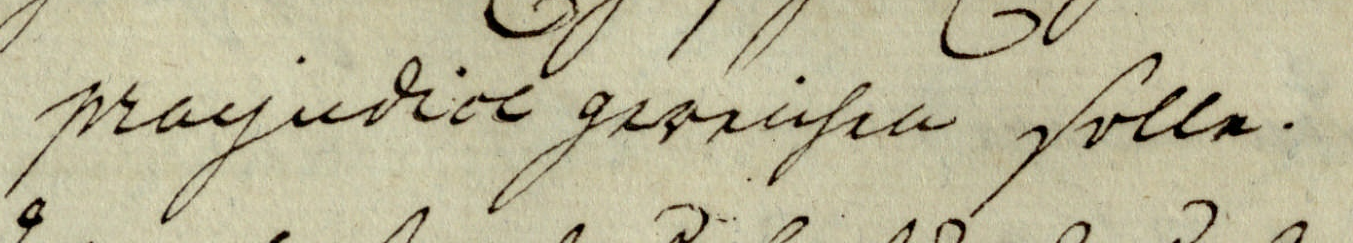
praejudice gereichen solle.
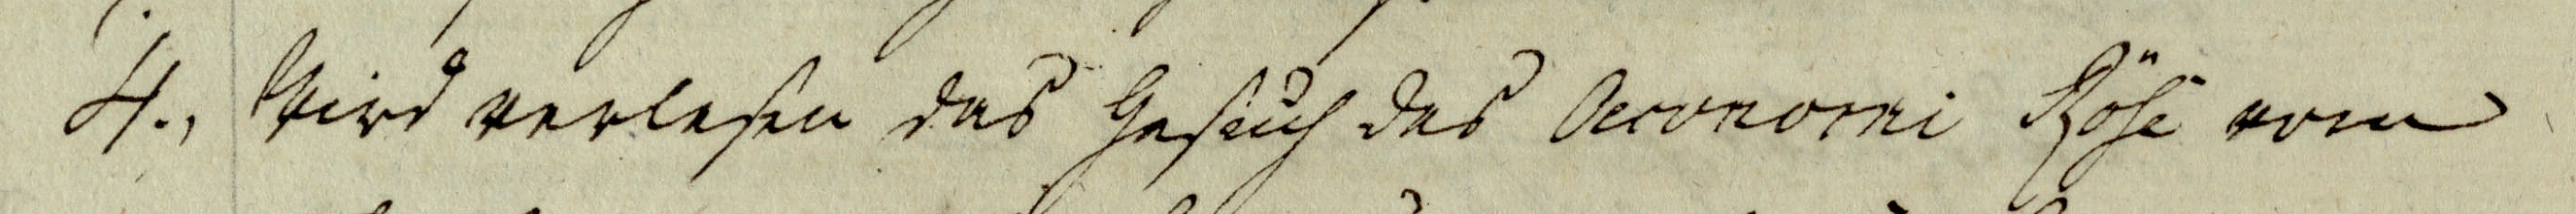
4., Wird verlesen das Gesuch des Oeconomi Röse vom
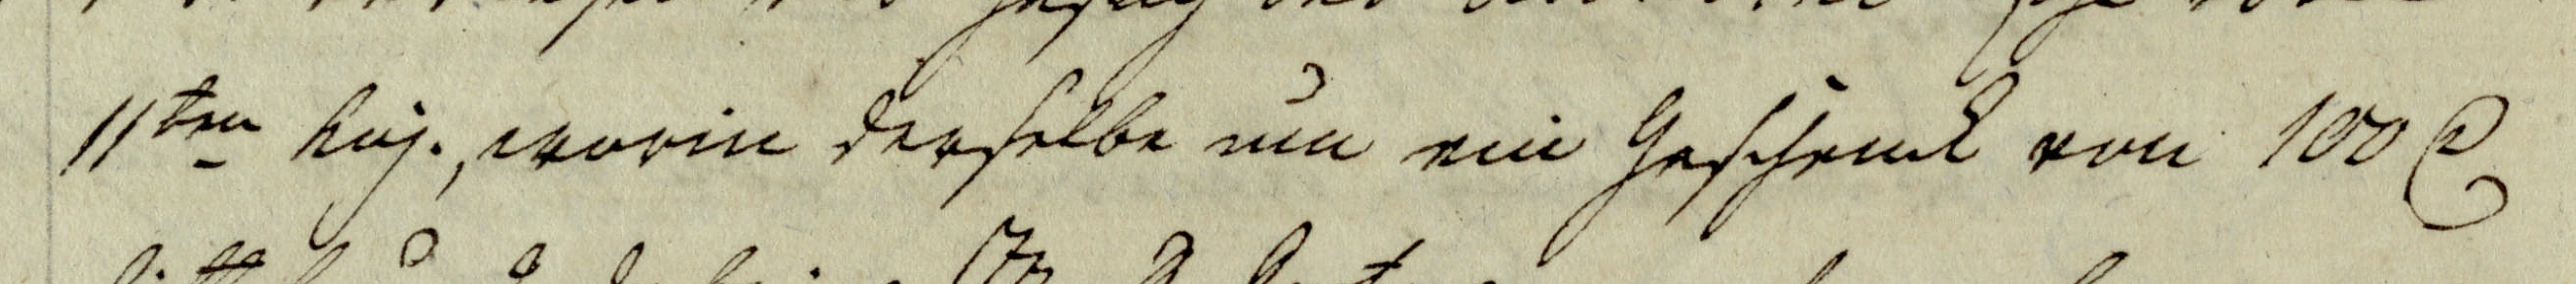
11 ten huj., worin derselbe um ein Geschenck von 100 l.
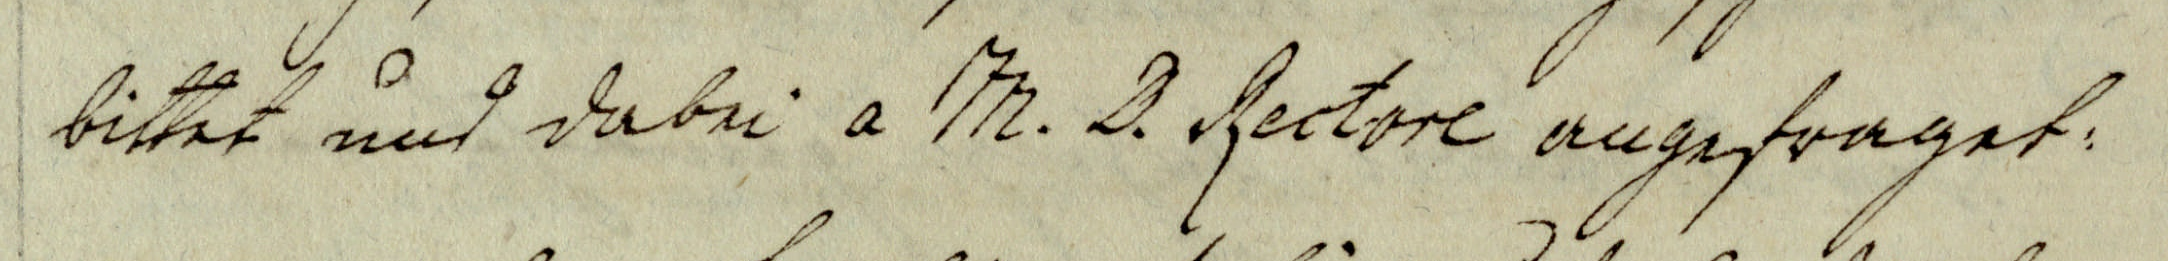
bittet und dabei a M. D. Rectore angefraget:
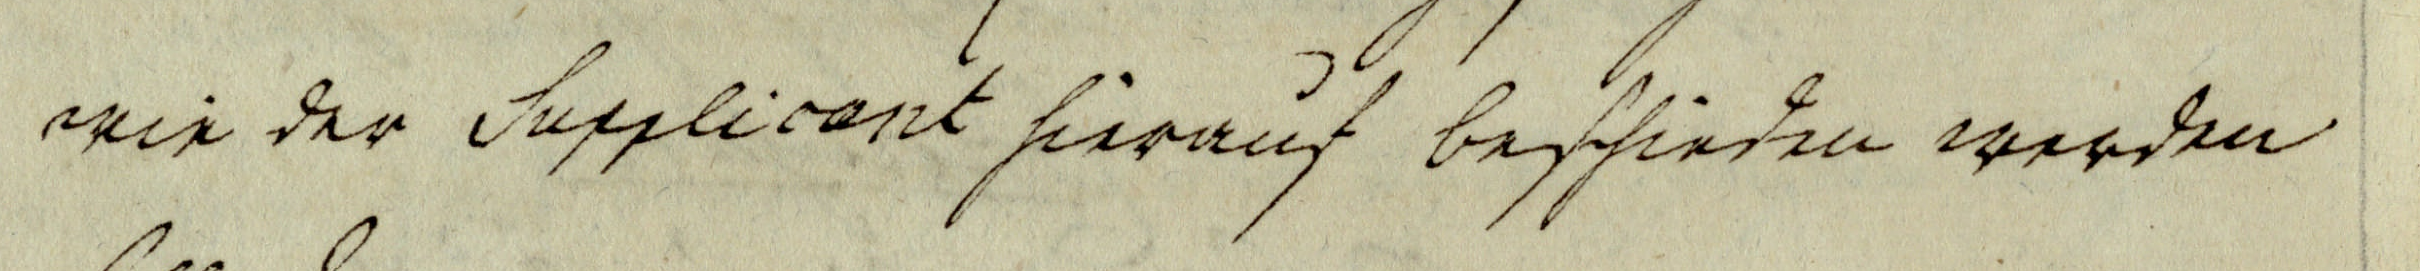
wie der Supplicant hierauf beschieden werden
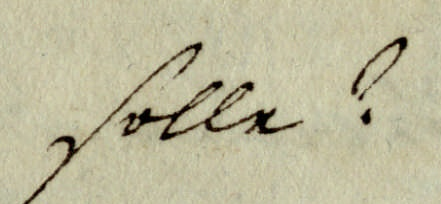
solle?
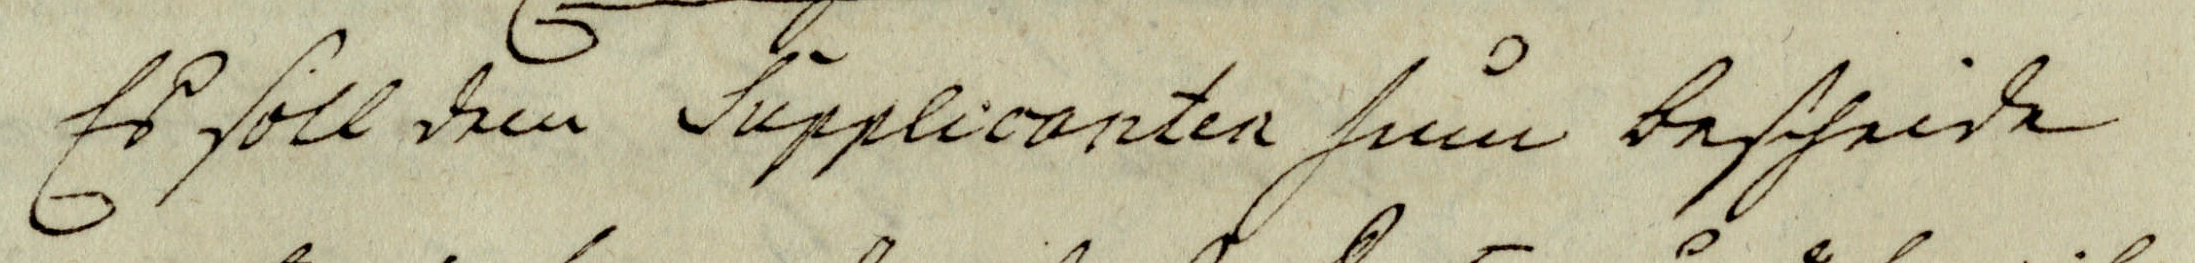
Es soll dem Supplicanten zum Bescheide
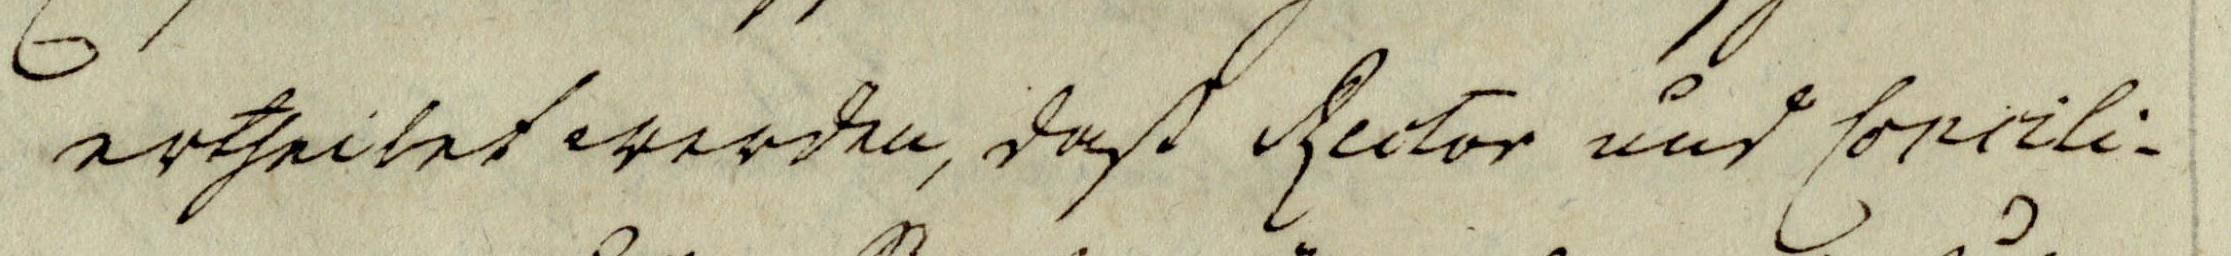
ertheilet werden, daß Rector und Concili¬
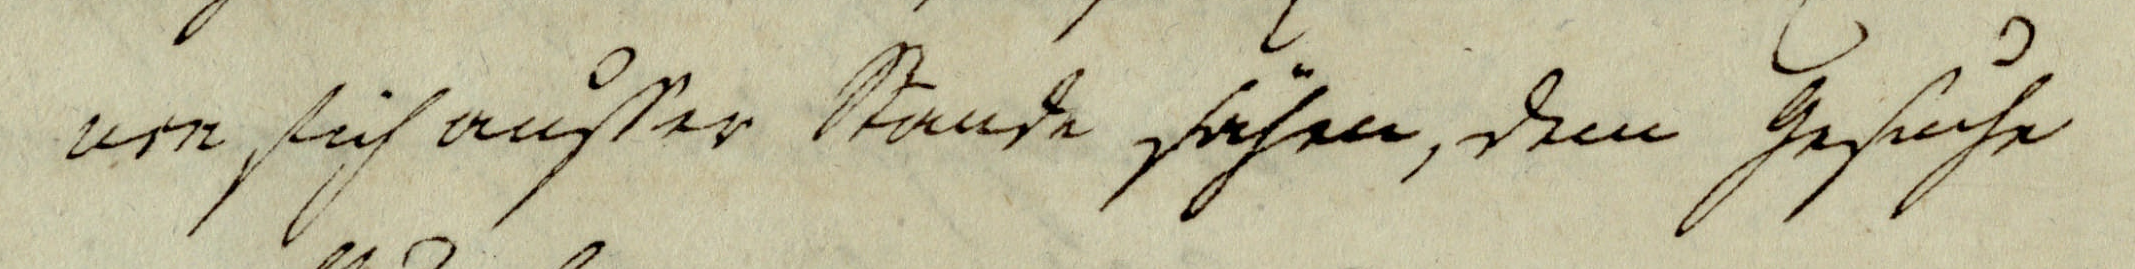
um sich ausser Stande sähen, dem Gesuche
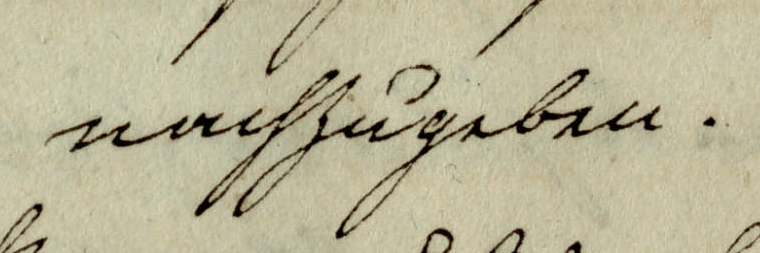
nachzugeben.
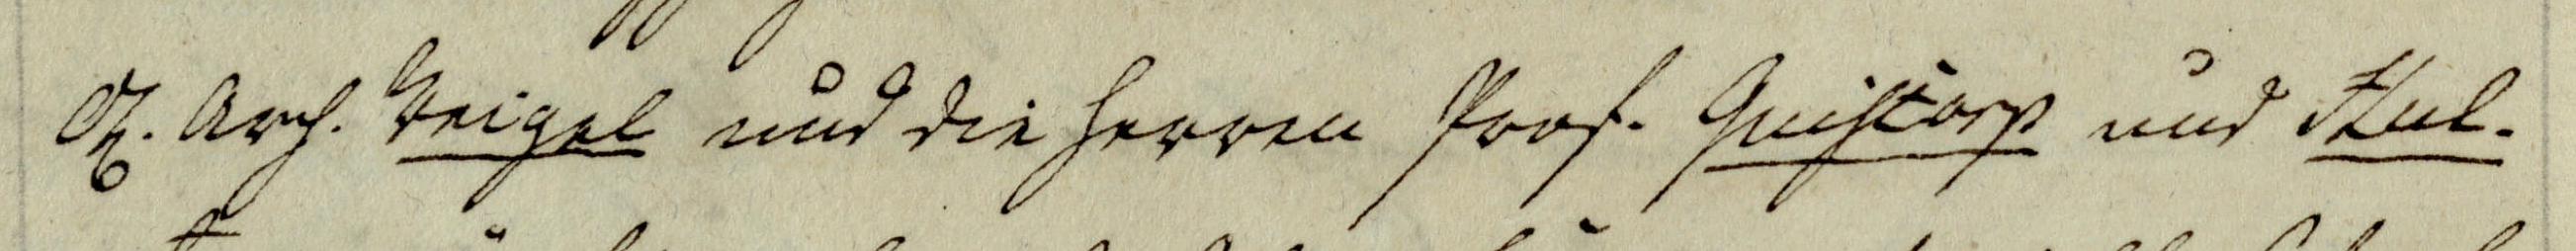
dh. Art. Weigel und die Herren Prof. Quistorp und Hul¬
